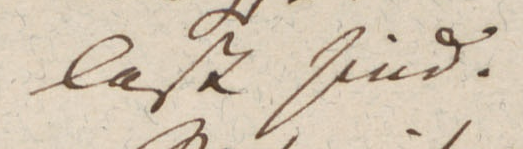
lost sind.
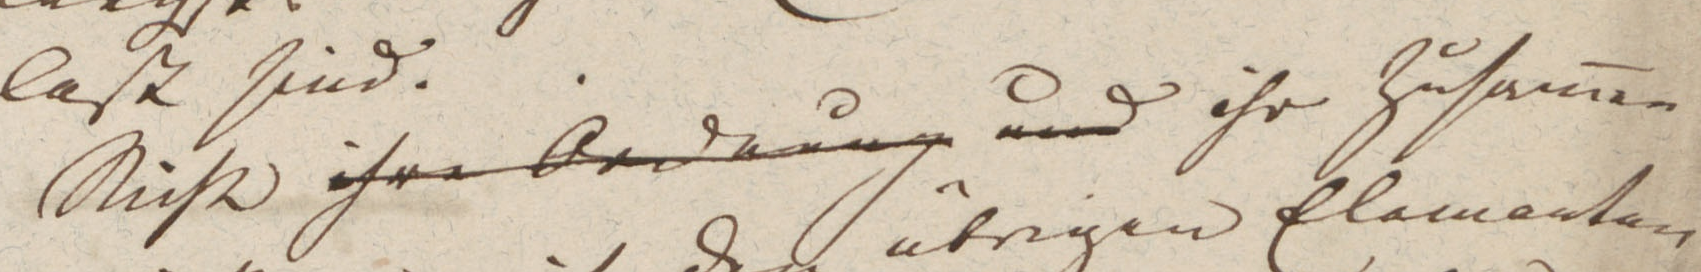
Nicht ihre Ordnung und ihr Zusammen
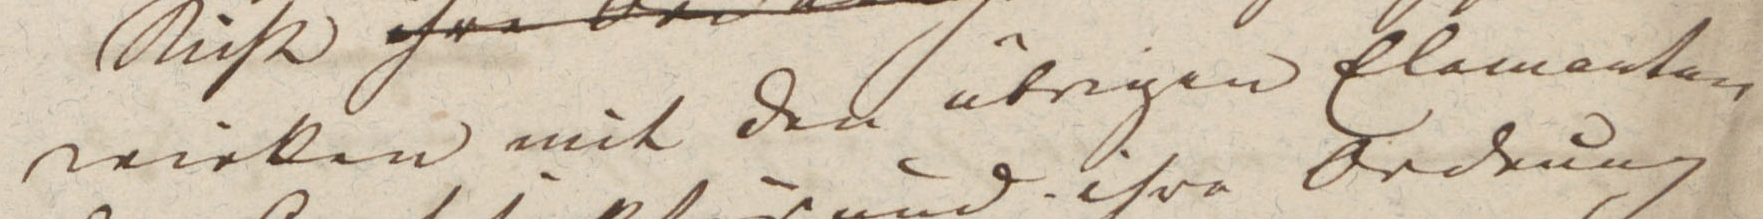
wirken mit den übrigen Elementen
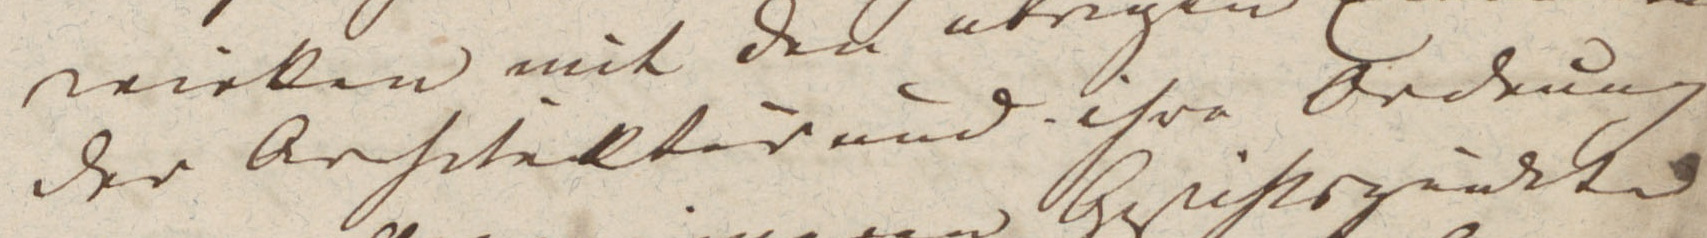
der Architektur und ihre Ordnung
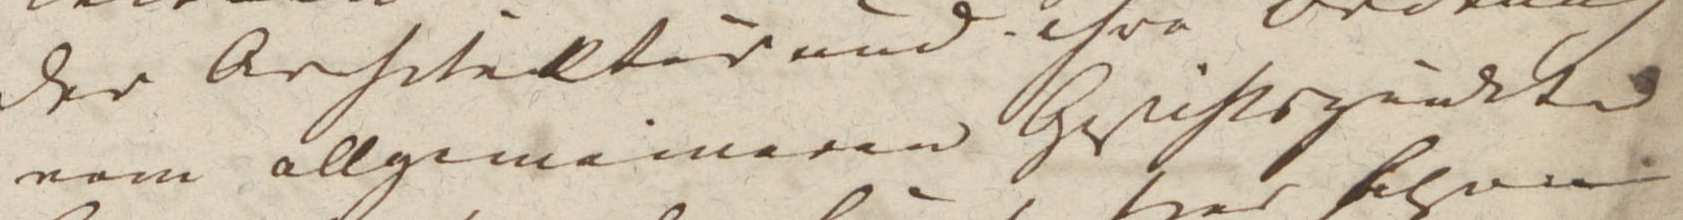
vom allgemeineren Gesichtspunkte
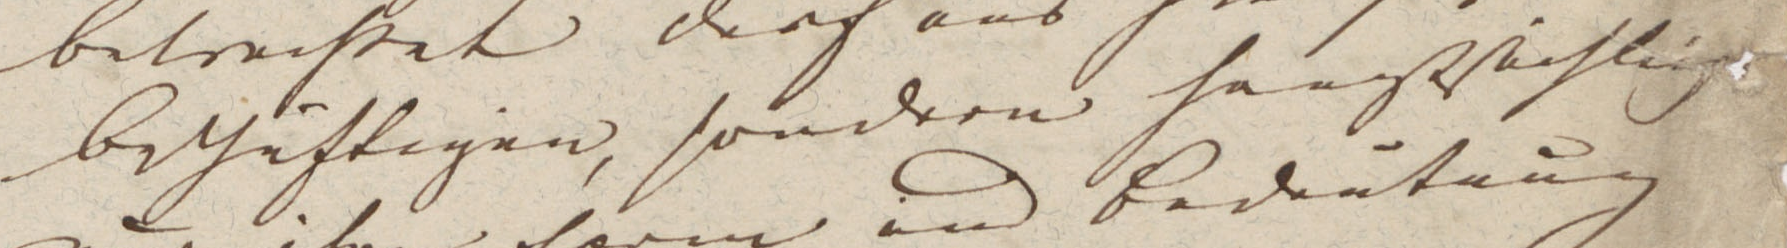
beschäftigen, sondern hauptsächlich
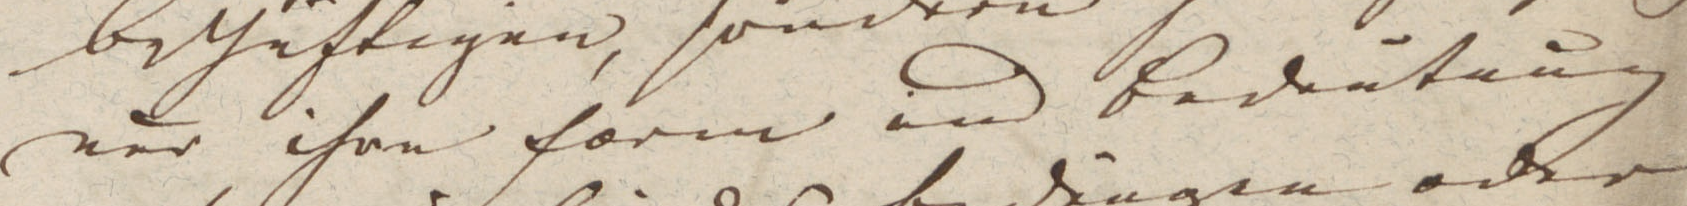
nur ihre Form und Bedeutung
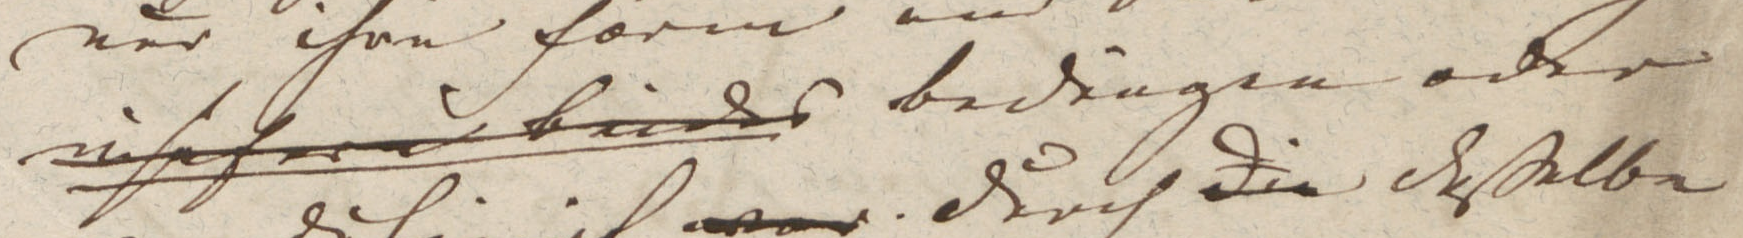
insofern beides bedungen oder
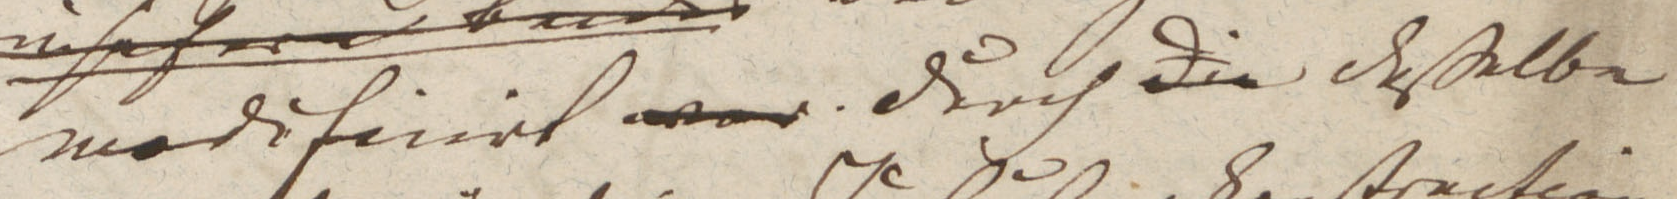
modificirt vor durch die dasselbe
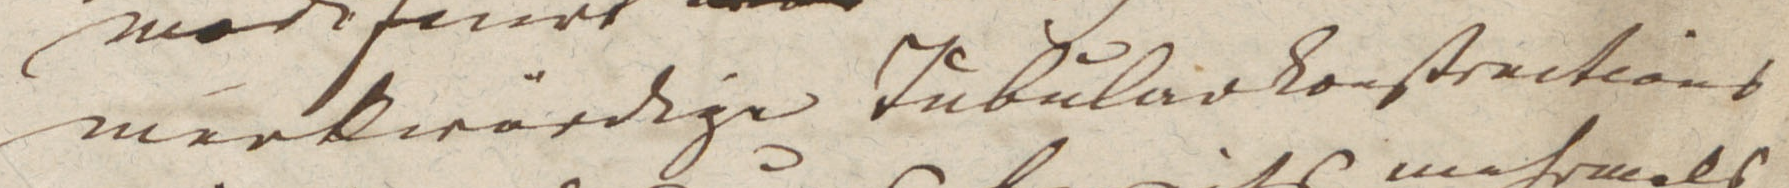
merkwürdige Tubularkonstructions
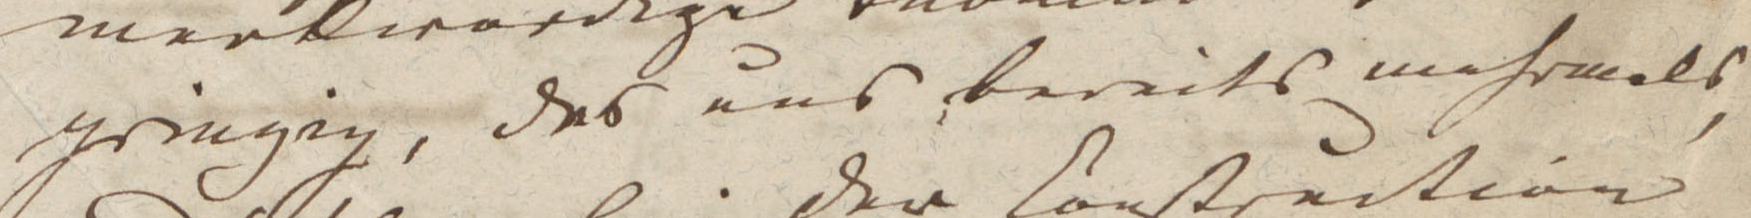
prinzip, das uns bereits mehrmals,
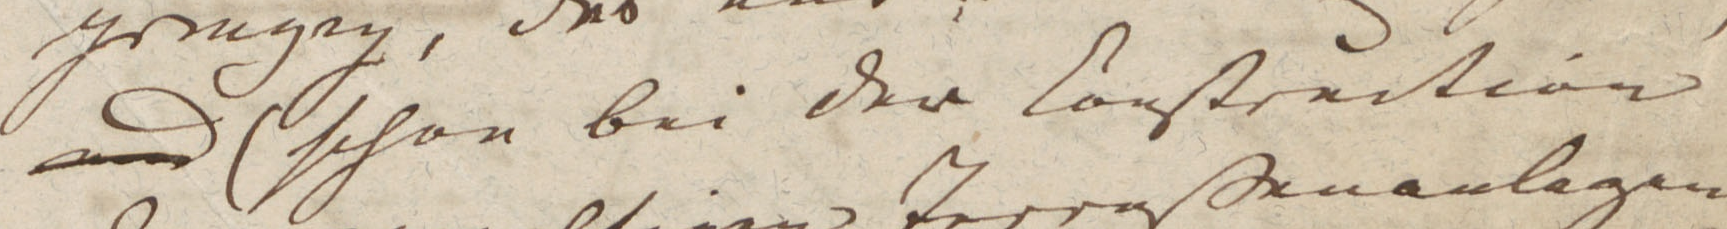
und (schon bei der Construction
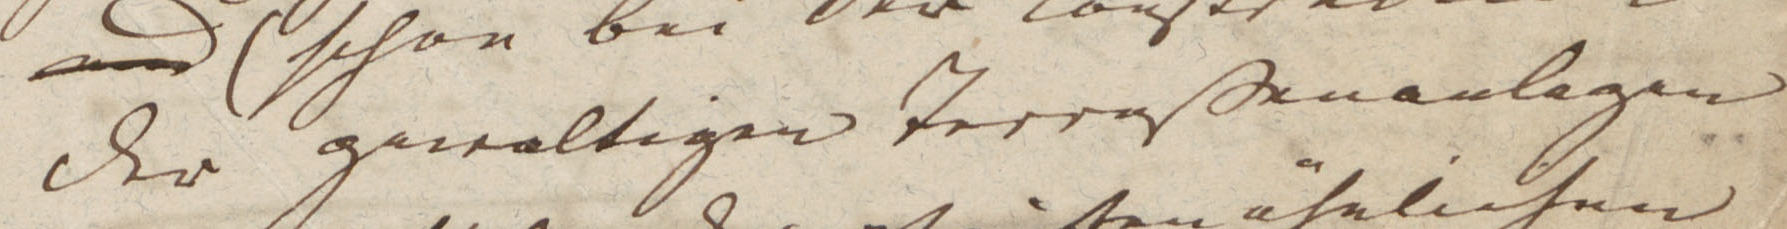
der gewaltigen Terrassenanlagen
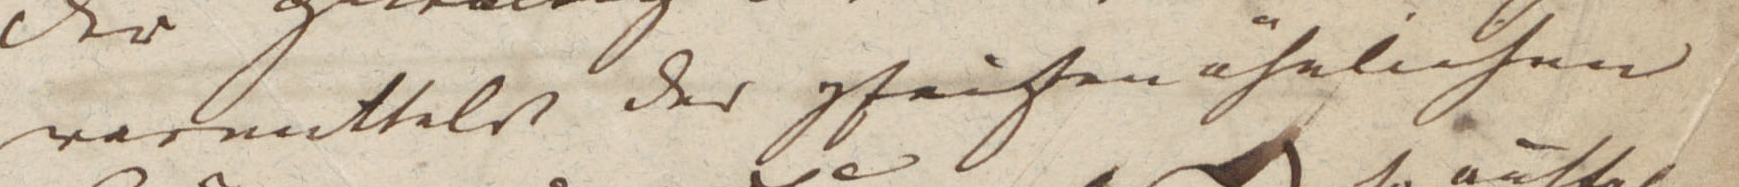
vermittels der ähnlichen
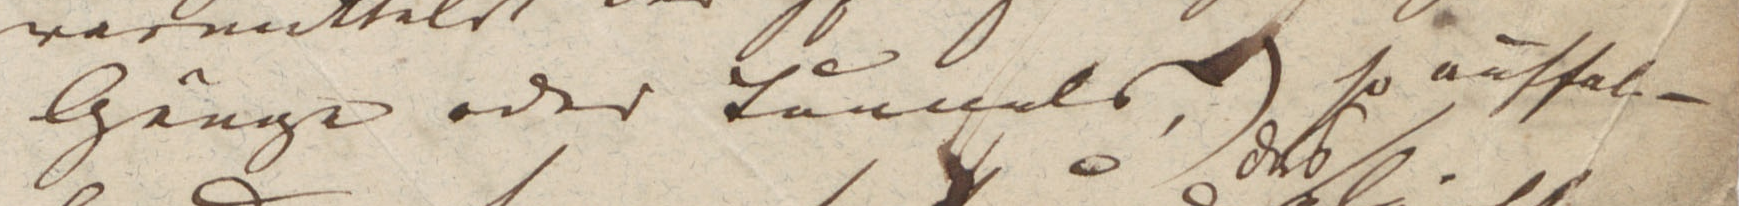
Gänge oder Tunnels,) so auffal-
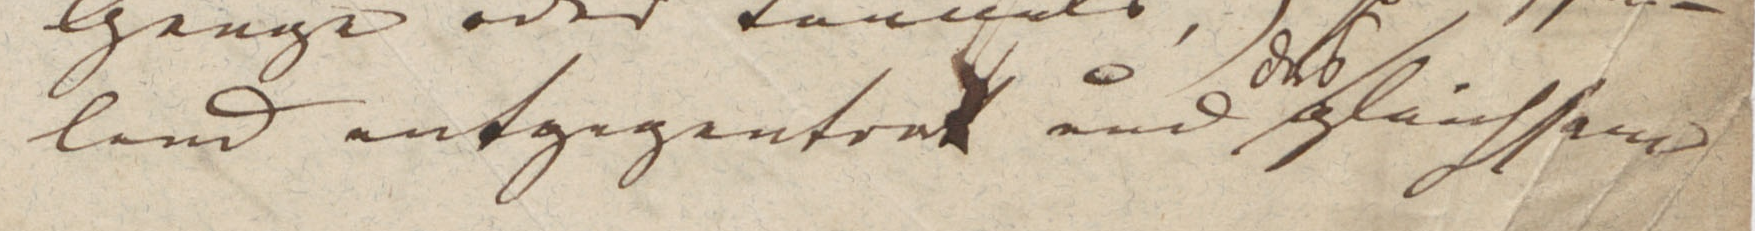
lend entgegentrat und das gleichsam
